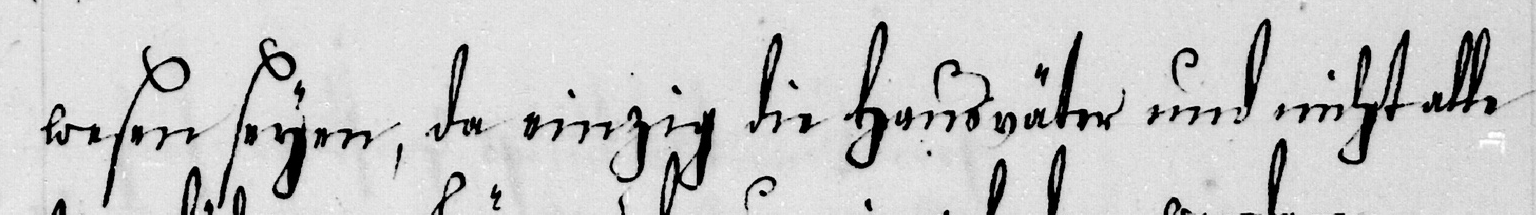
wesen seyen, da einzig die Hausväter und nicht alle
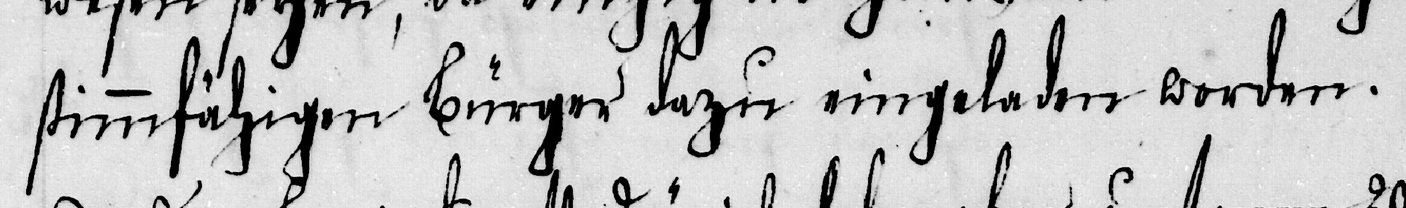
stimmfähigen Bürger dazu eingeladen worden.
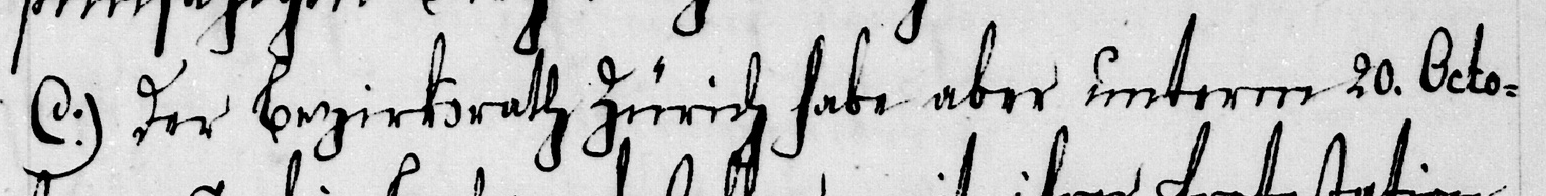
C.) Der Bezirksrath Zürich habe aber unterm 20. Octo¬
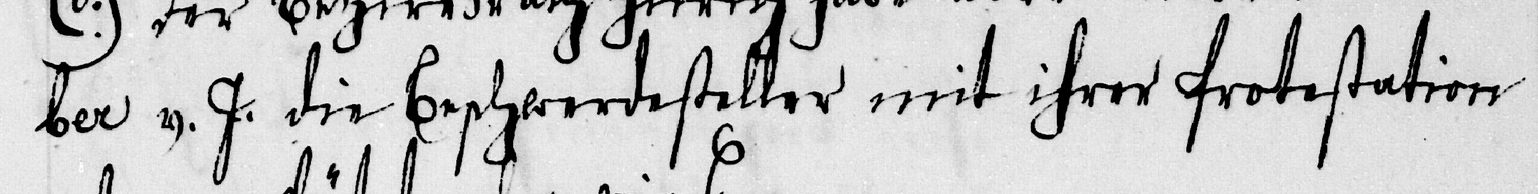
ber v. J. die Beschwerdesteller mit ihrer Protestation
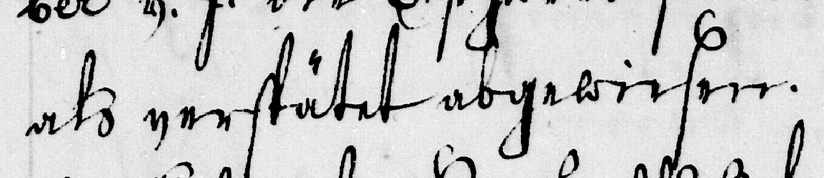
als verspätet abgewiesen.
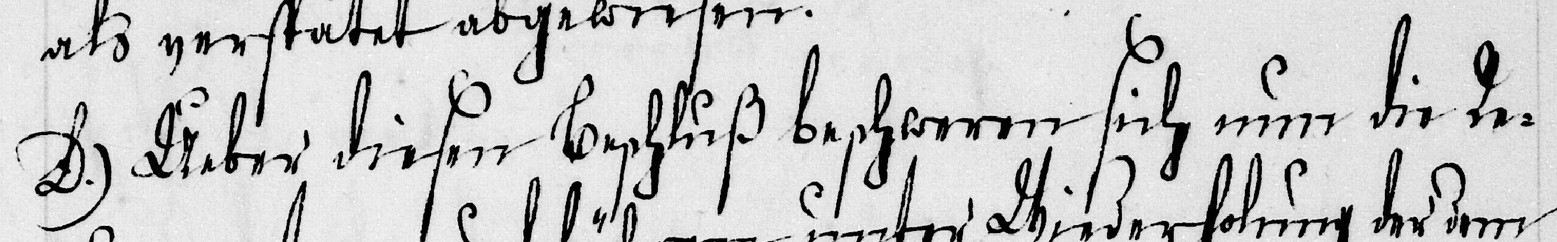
D.) Ueber diesen Beschluß beschweren sich nun die Re¬
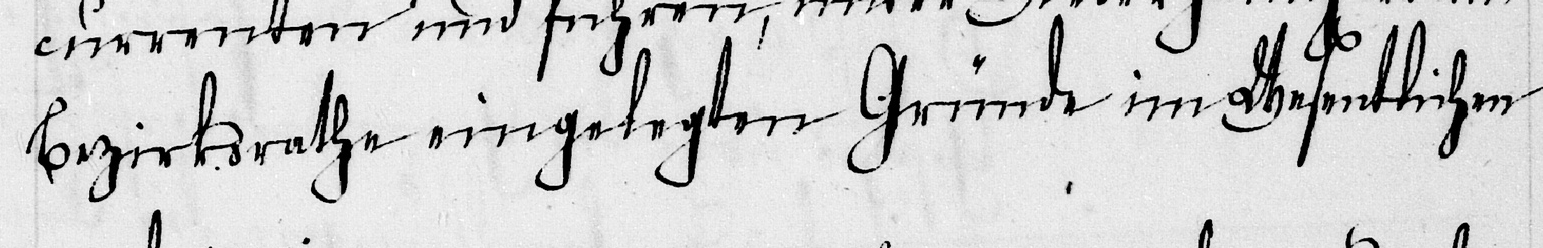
Bezirksrathe eingelegten Gründe im Wesentlichen
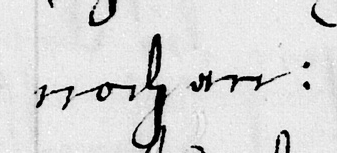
noch an:
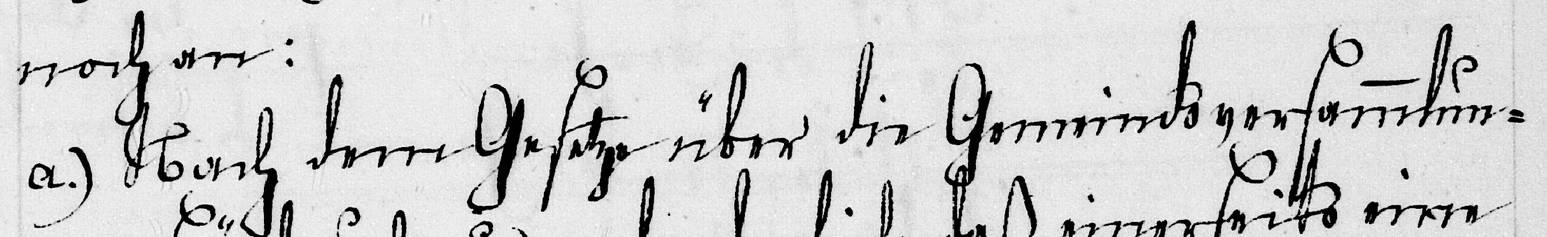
a.) Nach dem Gesetz über die Gemeindsversammlun¬
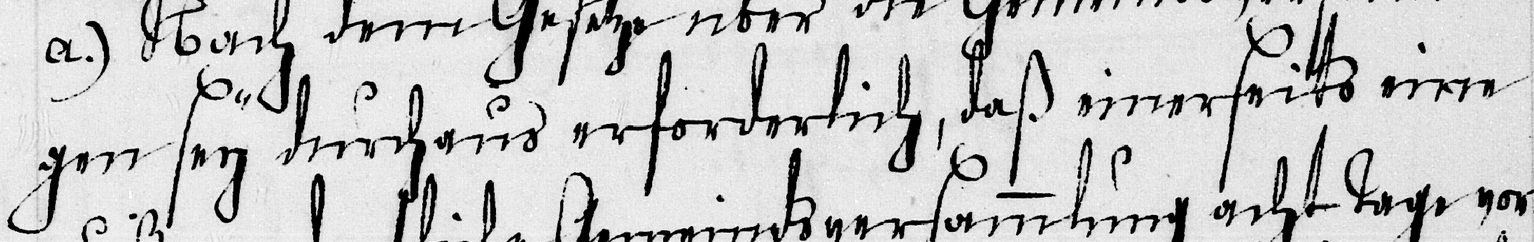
gen sey durchaus erforderlich, daß einerseits eine
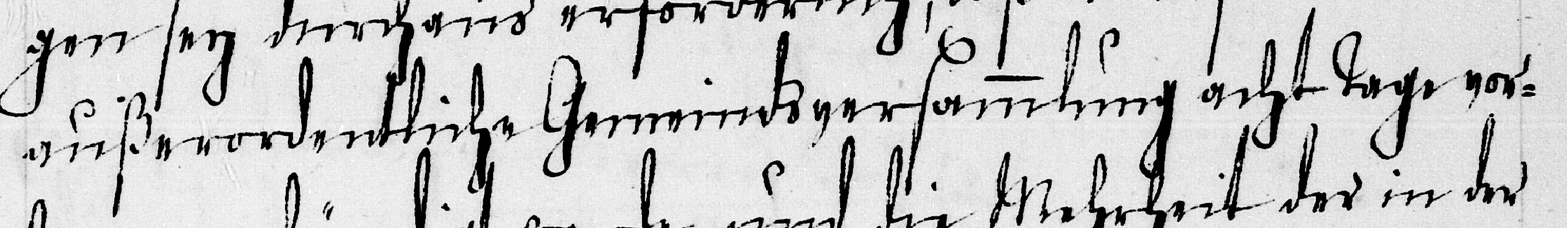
außerordentliche Gemeindsversammlung acht Tage vor¬
